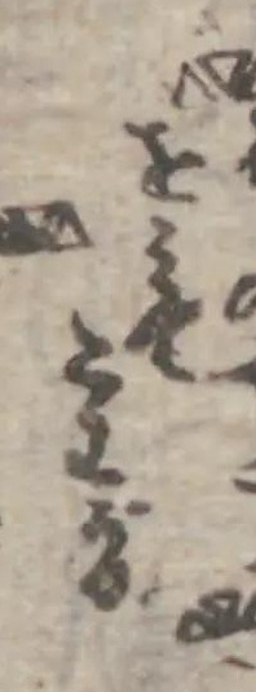こわがる
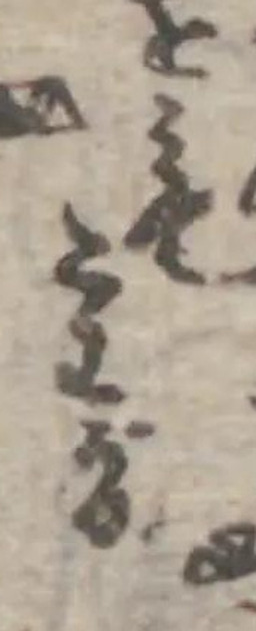こわがる
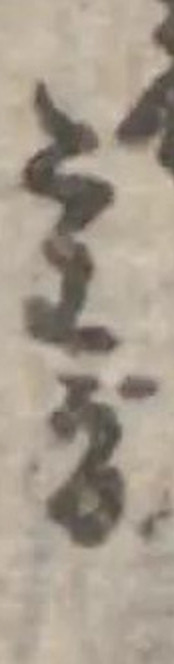こわがる
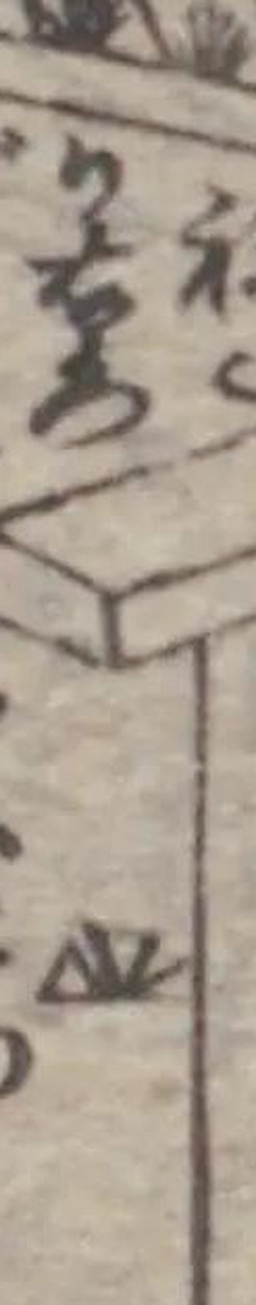か右衛門
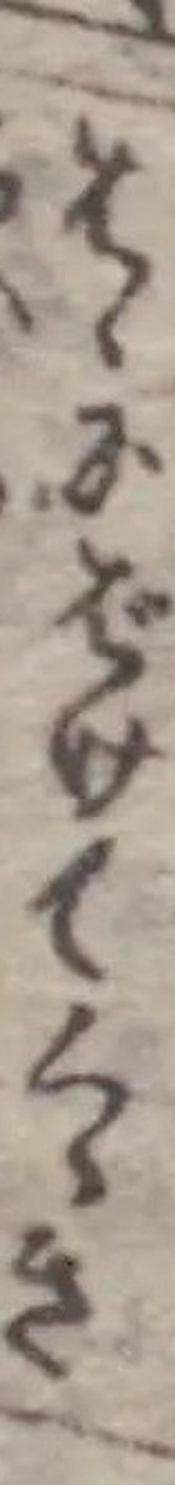はゝにばけてくらき
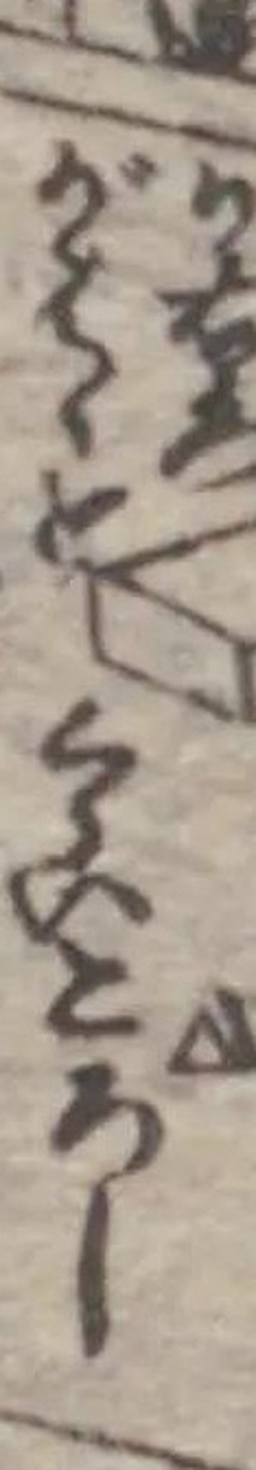がはゝをくらいころし
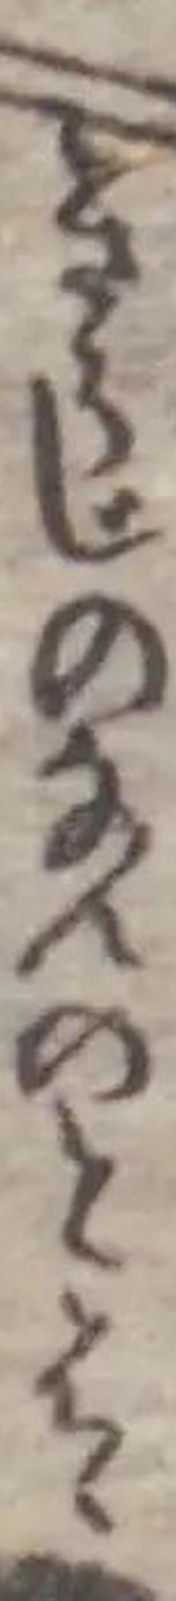きうじのなんのとはゝ
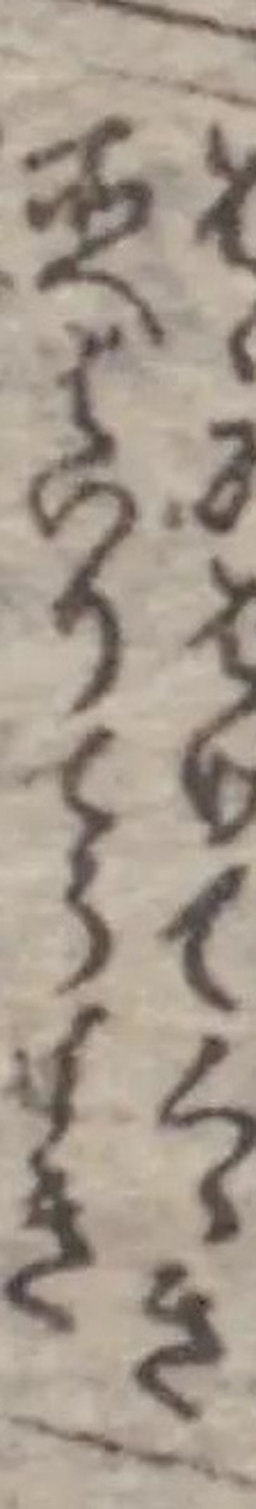所へはいりてうしき
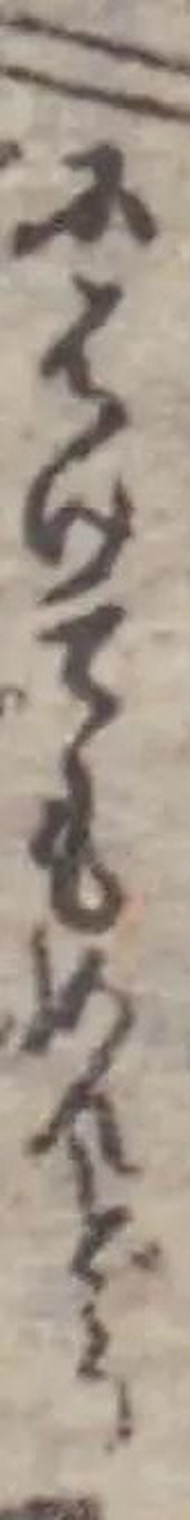にはけてもめんどう
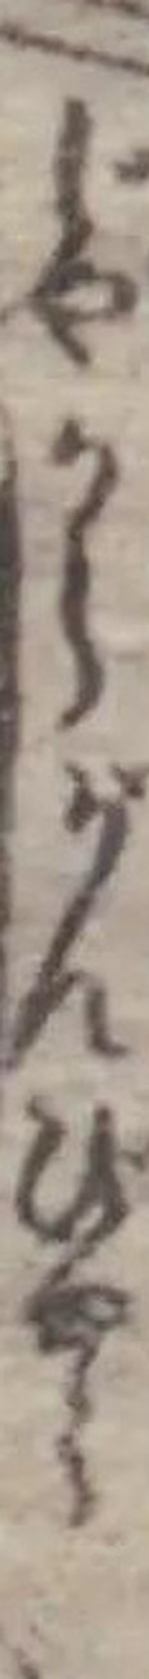じやからがんびやう
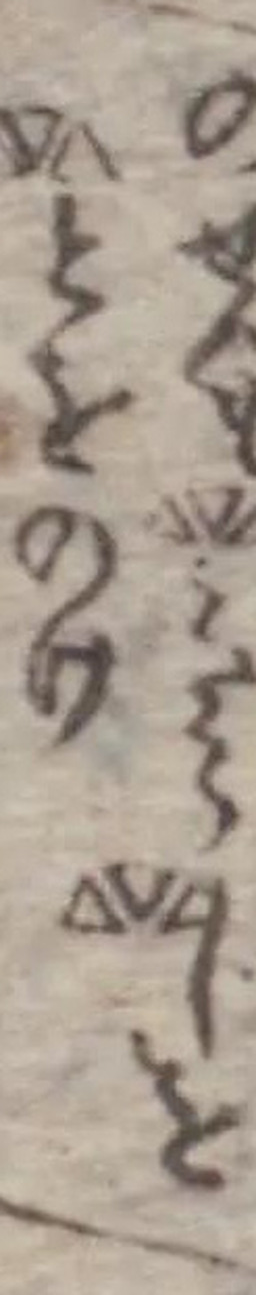とをのけ
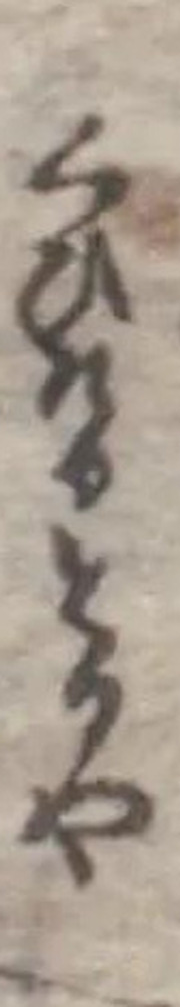くひけるとかや
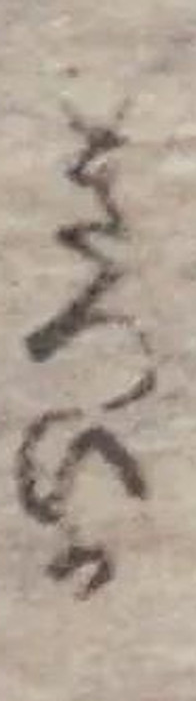きついか

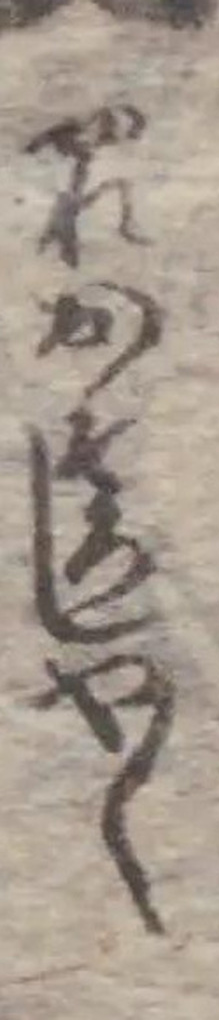やれおそろしや〳〵
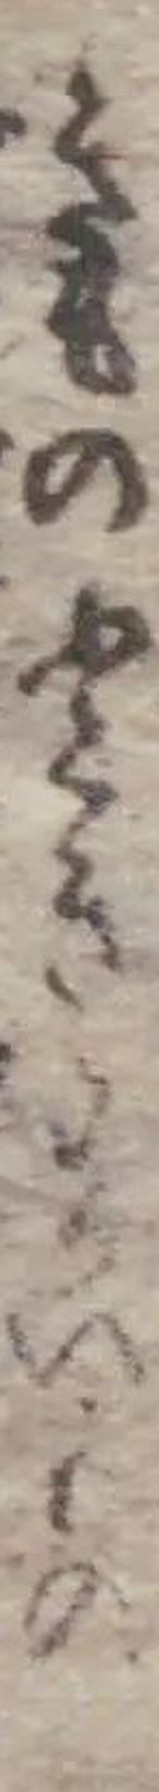きものふときわかいもの
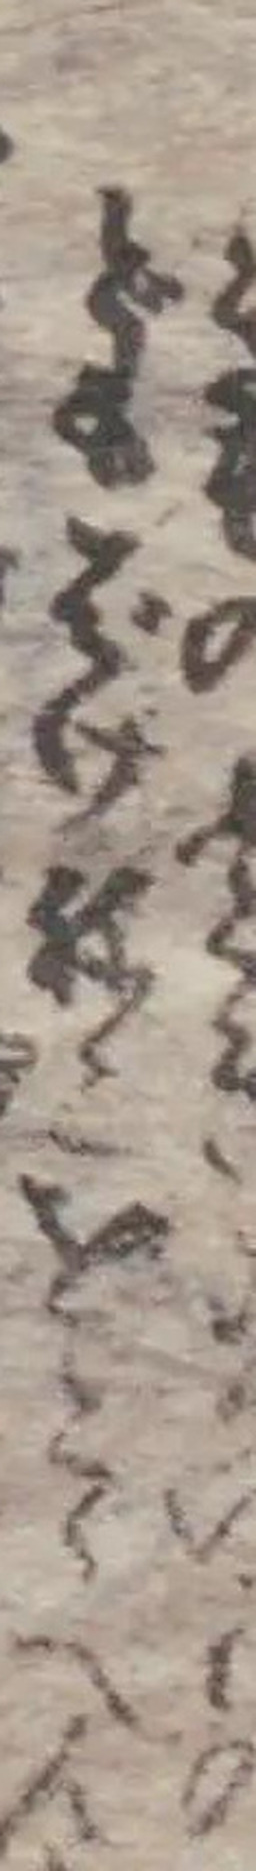どもばけねこをとらへんと
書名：鎌田又八 2巻
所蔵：国立国会図書館 National Diet Library, JAPAN
